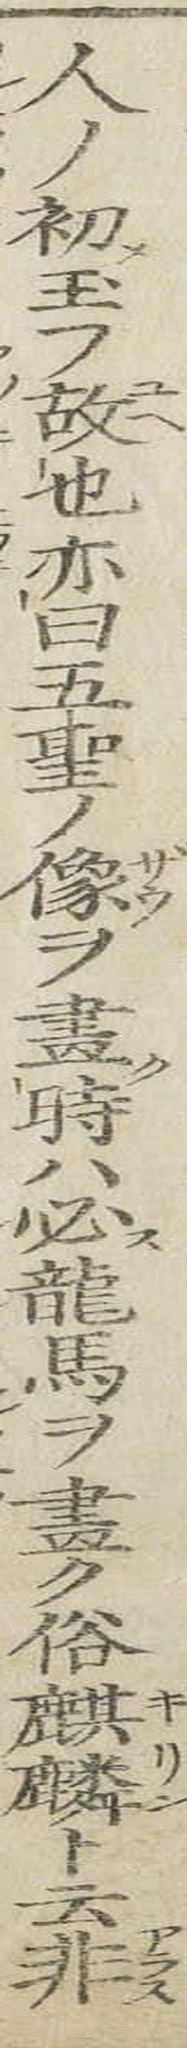人ノ初玉フ故-也亦-曰五-聖ノ像ヲ画-時ハ必竜馬ヲ画ク俗麒麟ト云非
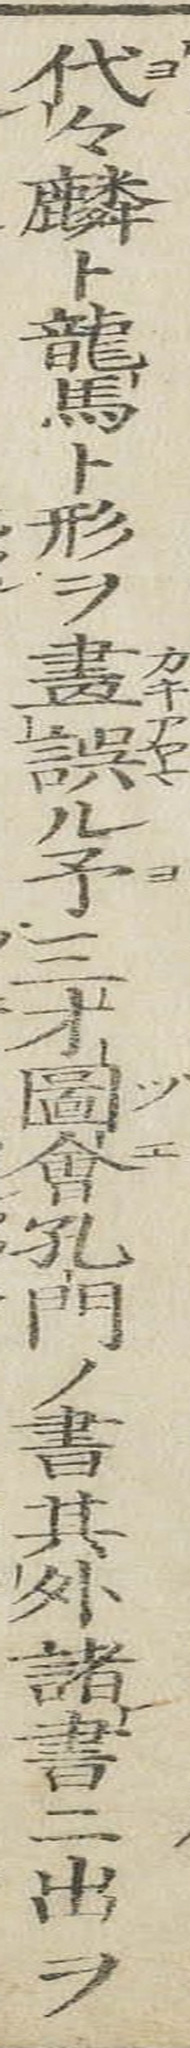代-々麟ト竜-馬ト形ヲ画-誤ル予三-才-図-会孔-門ノ書其-外諸-書ニ出ヲ
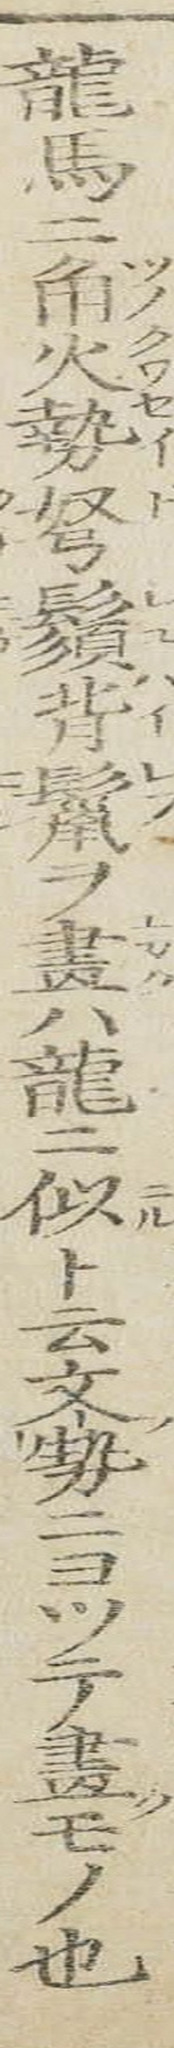竜馬ニ角火勢弩鬚背鬣ヲ画ハ竜ニ似ト云文-勢ニヨツテ画モノ也
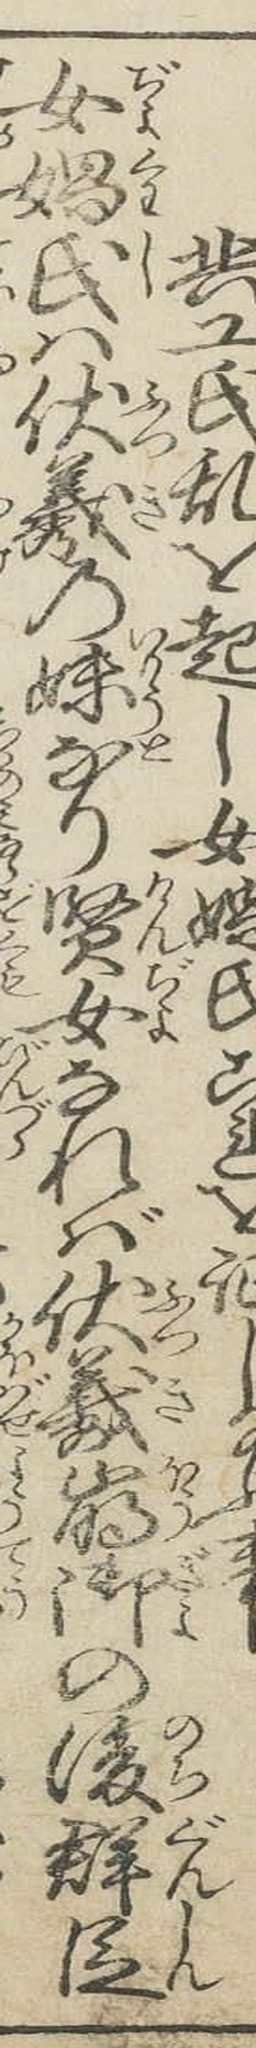女媧氏は伏羲の妹なり賢女なれば伏羲崩御の後群臣
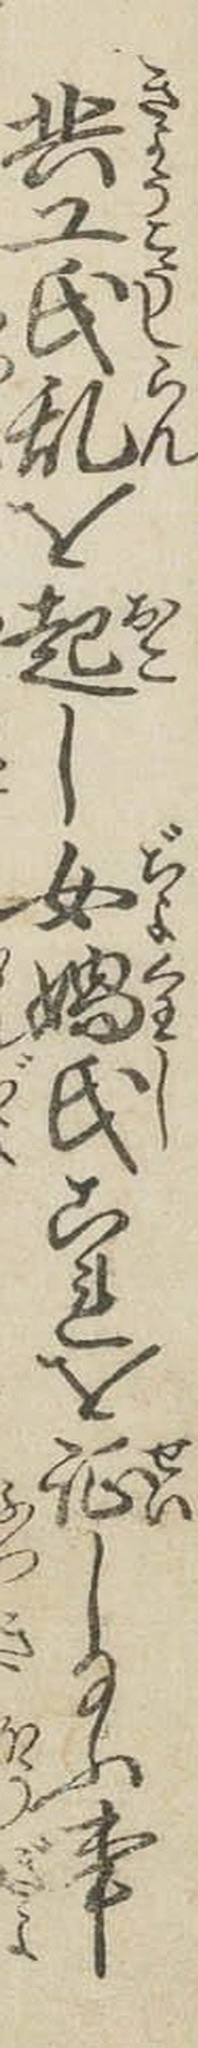共工氏乱を起し女媧氏これを征し給ふ事
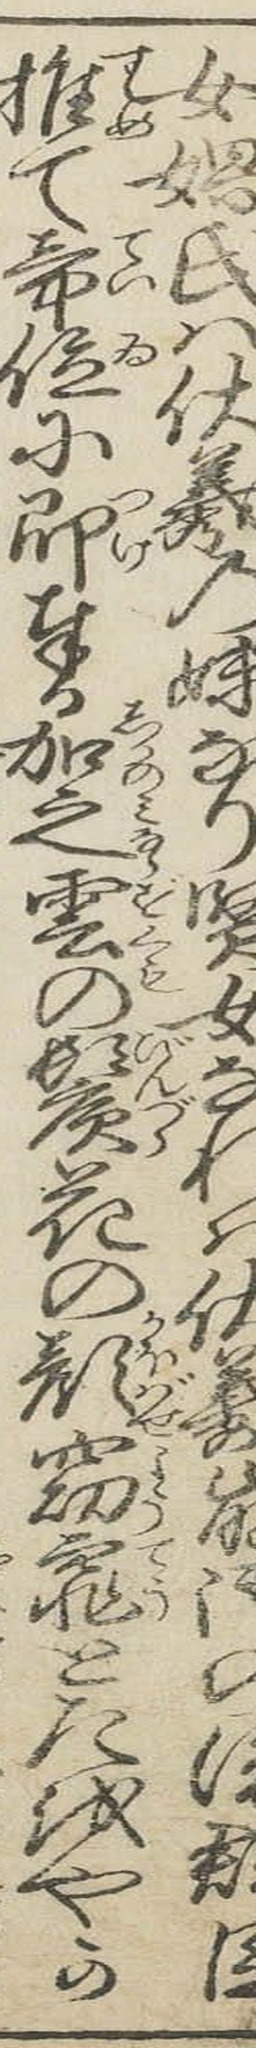推て帝位に即奉る加之雲の鬢花の顔窈窕とたをやか
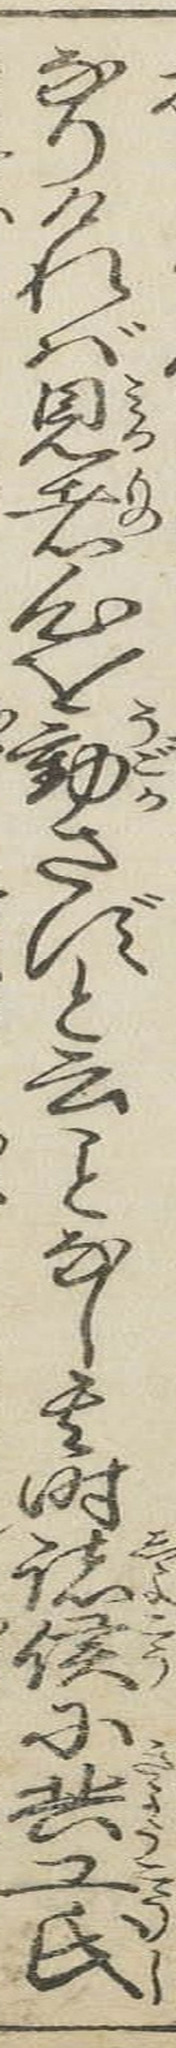なりければ見者心を動さずと云ことなし其時諸侯に共工氏
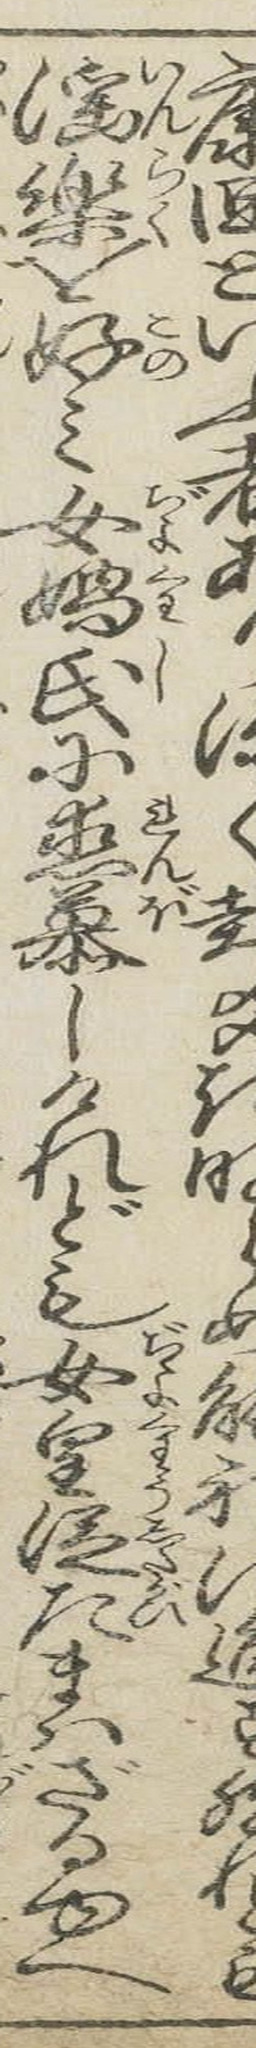淫楽を好み女媧氏に恋慕しけれども女皇従たまはざるゆへ
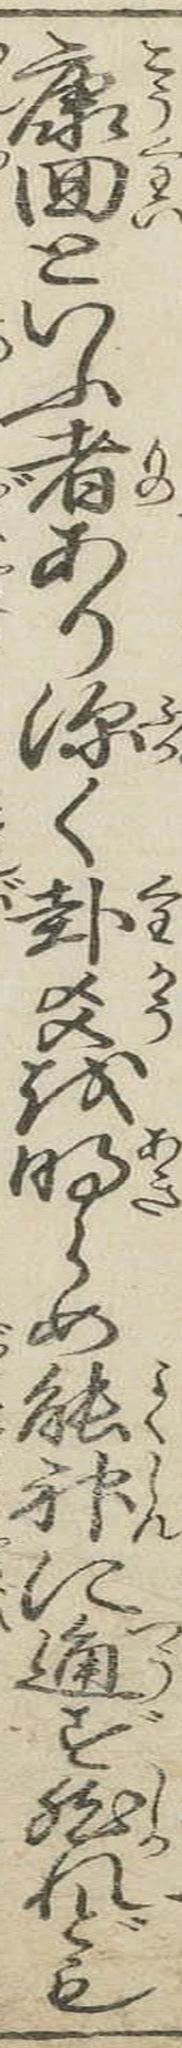康回といふ者あり深く卦爻を明らめ能神に通ず然れども
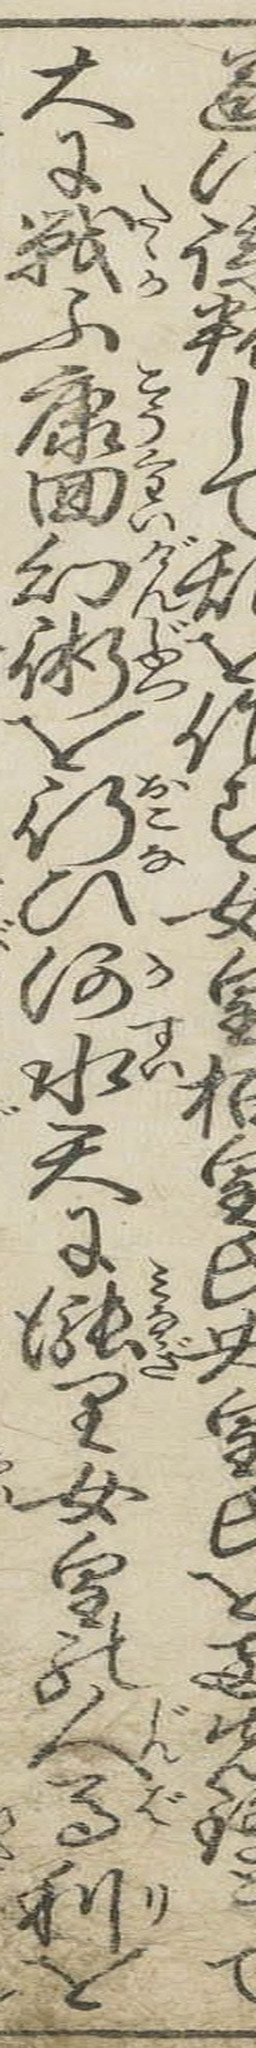大に戦ふ康回幻術を行ひ河水天に漲り女皇の人馬利を
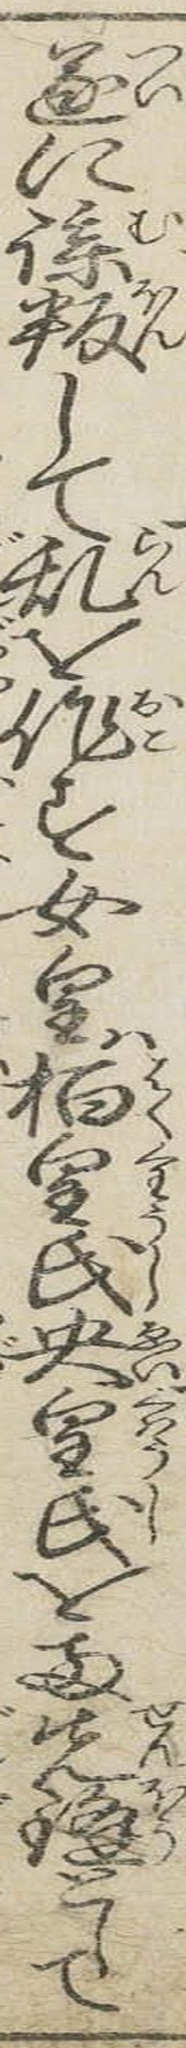遂に謀叛して乱を作す女皇は柏皇氏央皇氏を両先鋒として
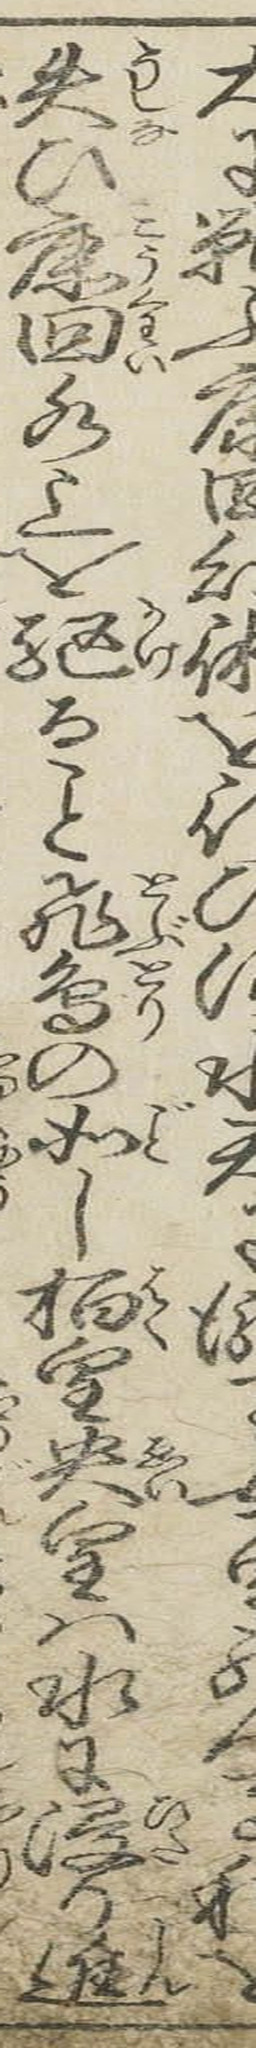失ひ康回水上を駆ること飛鳥の如し柏皇央皇は水に浸り進
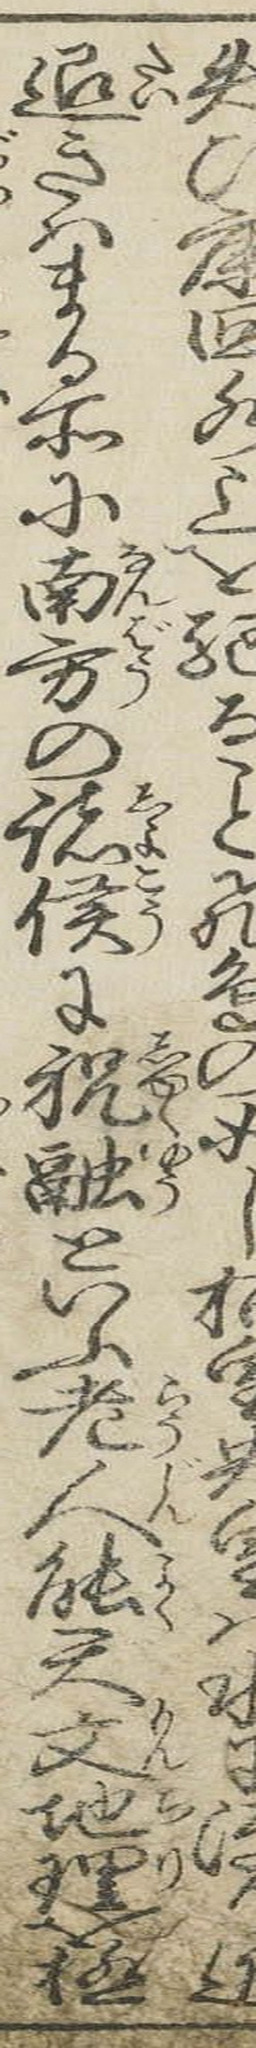退きはまる所に南方の諸侯に祝融といふ老人能天文地理を極
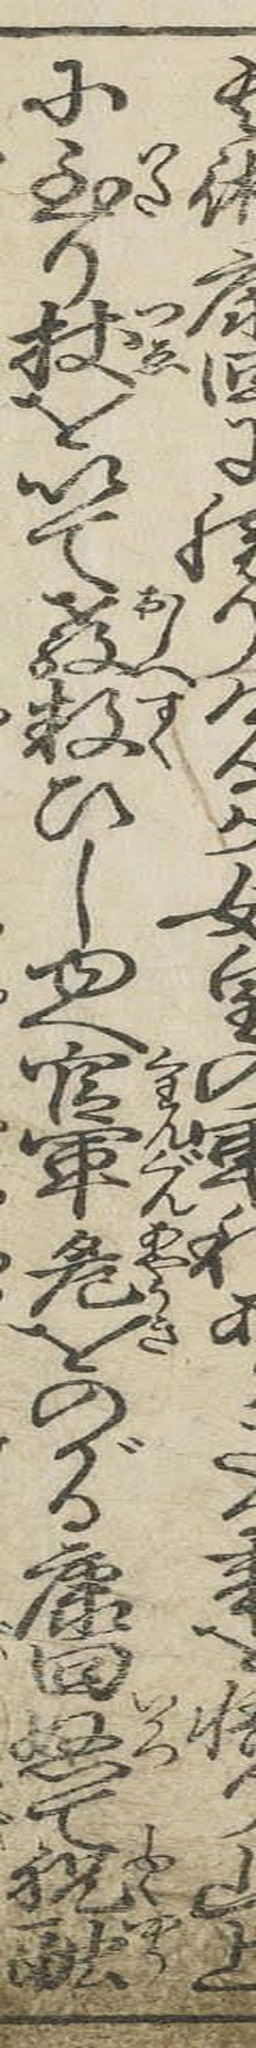に至り杖を以て教救ひしゆへ官軍危をのがる康回怒て祝融
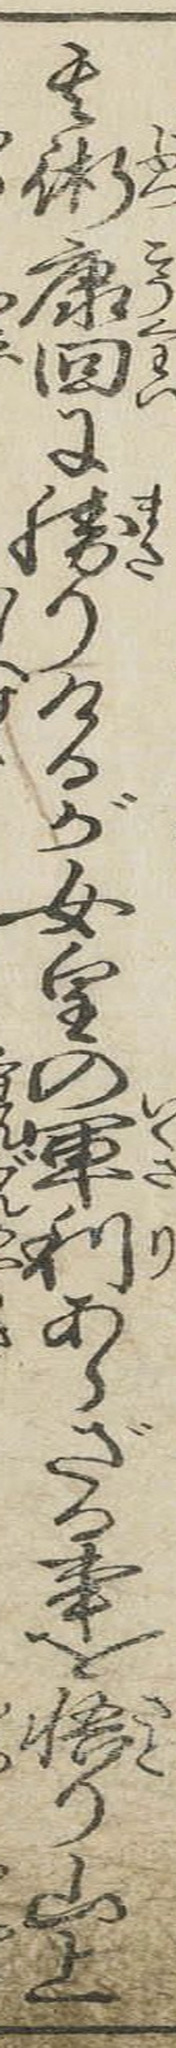其術康回に勝りけるが女皇の軍利あらざる事を悟り山上
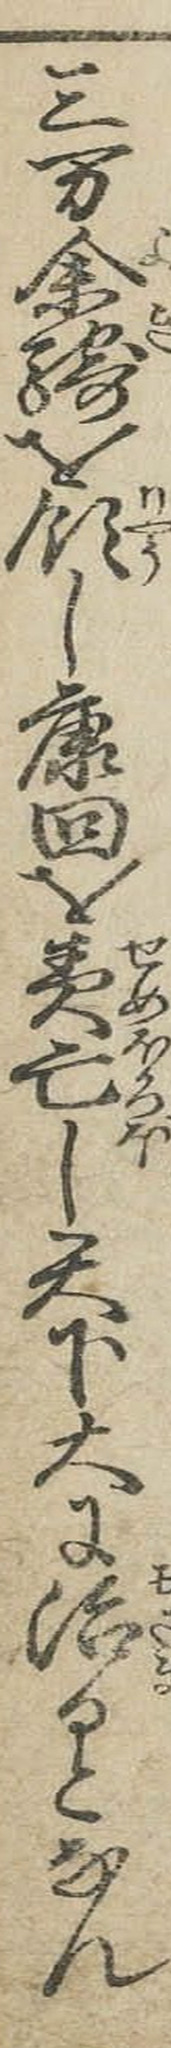三万余騎を領し康回を責亡し天下大に治るとなん
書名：絵本写宝袋 9巻 4之巻
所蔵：東京学芸大学教育コンテンツアーカイブ
